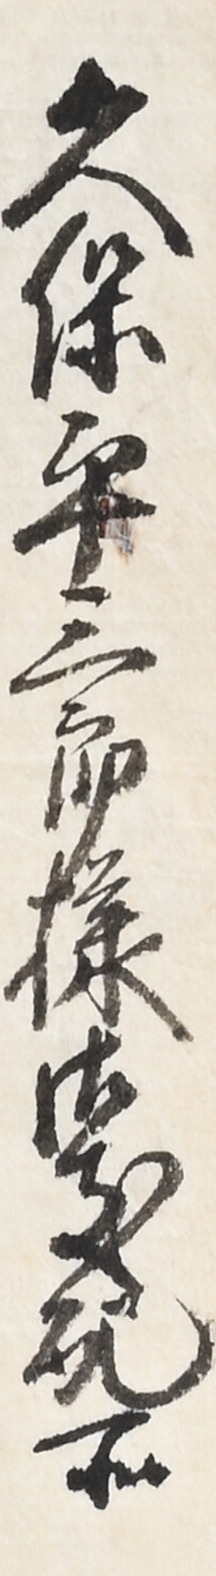久保平三郎様御支配所
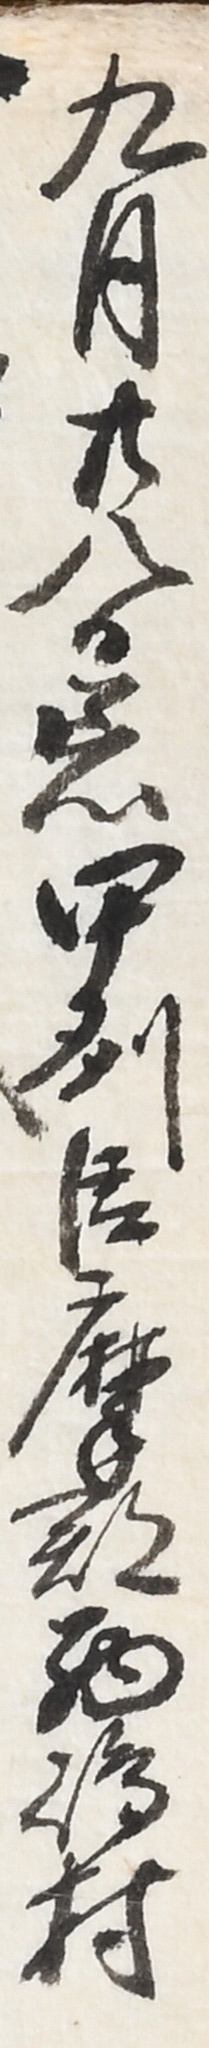九月廿八日着甲州巨摩郡西嶋村
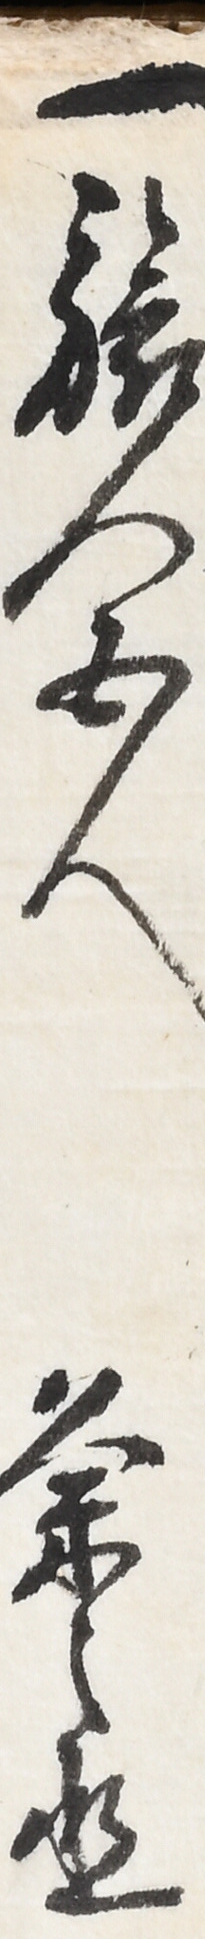一旅人五人粂之丞
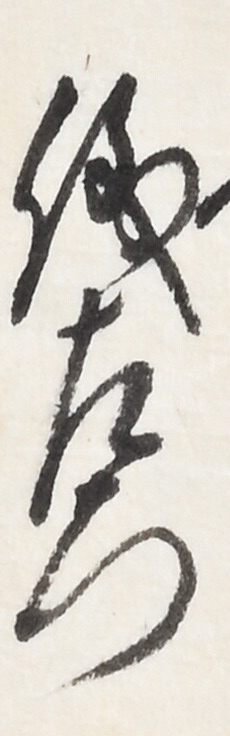儀左衛門
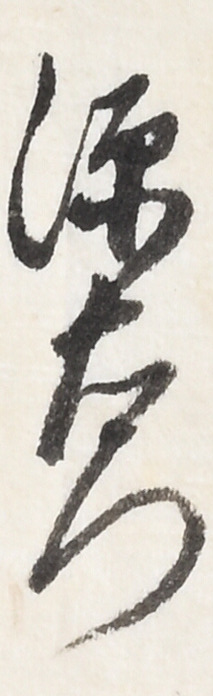源右衛門
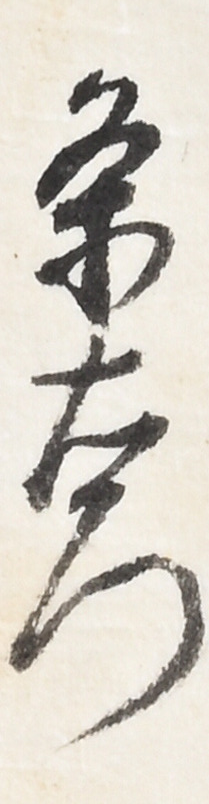条右衛門
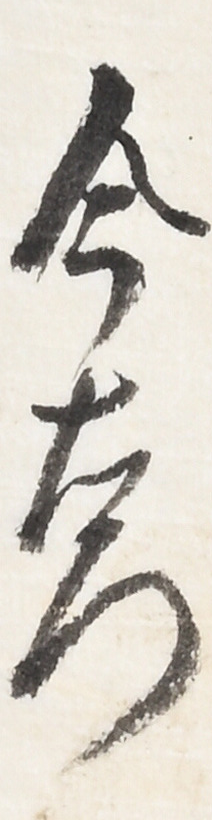今右衛門
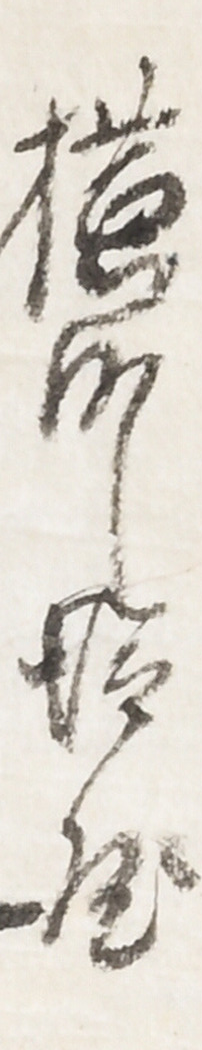横町塩屋
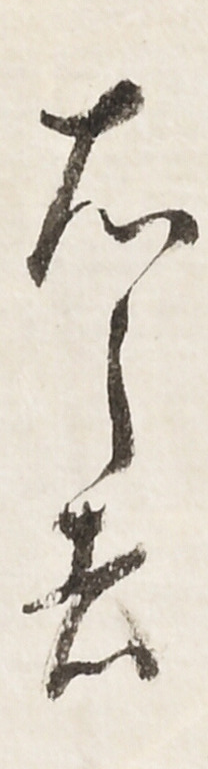右之者
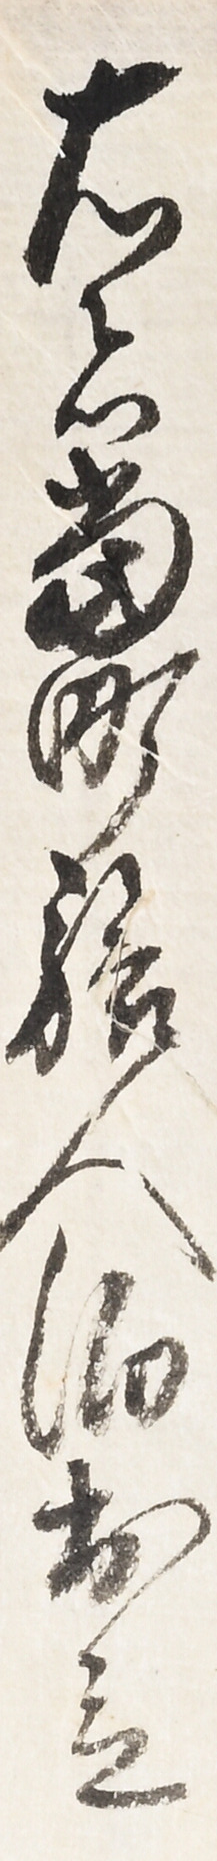右者当町旅人泊出立
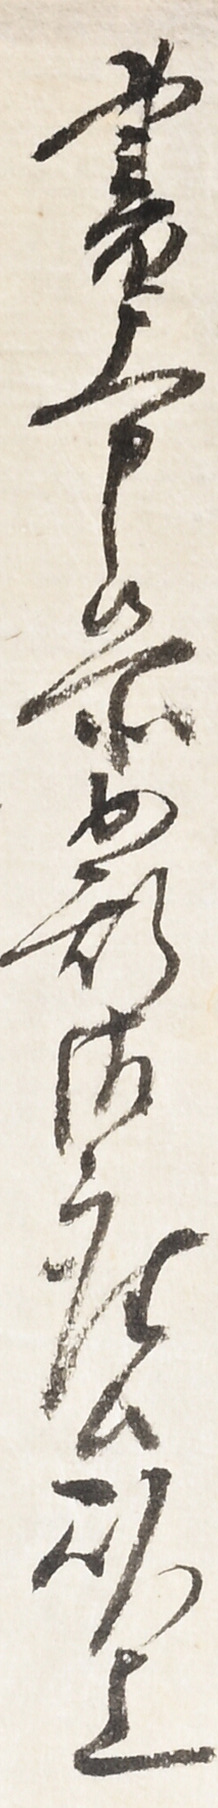書上申候所如斯御座候以上
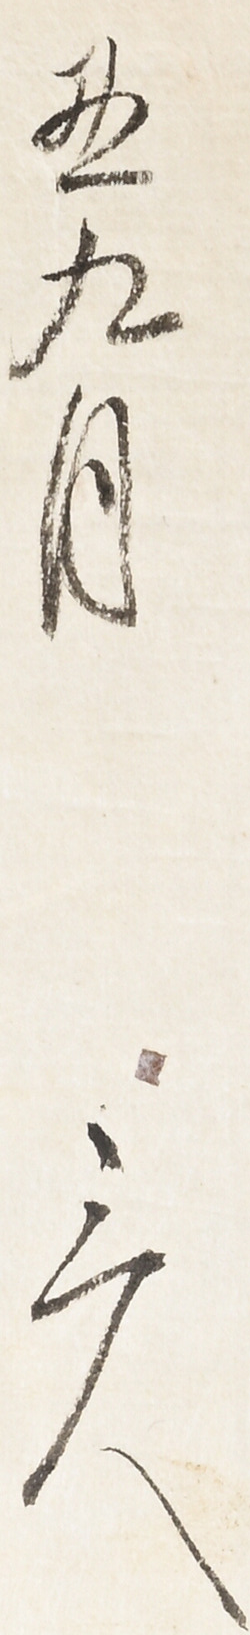丑九月三人
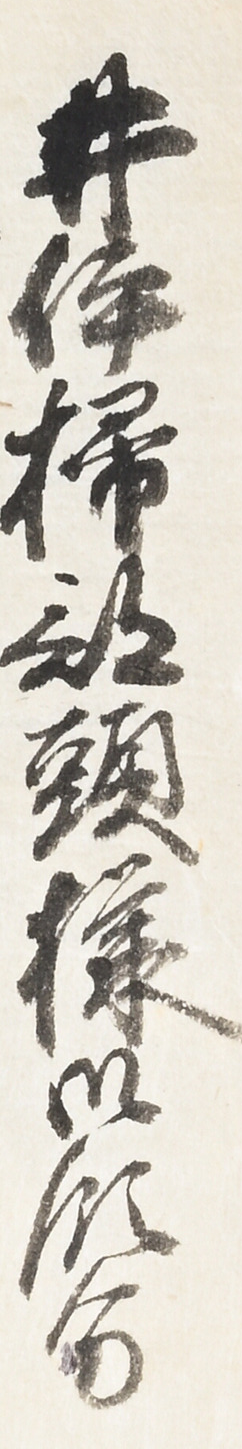井伊掃部頭様御領分
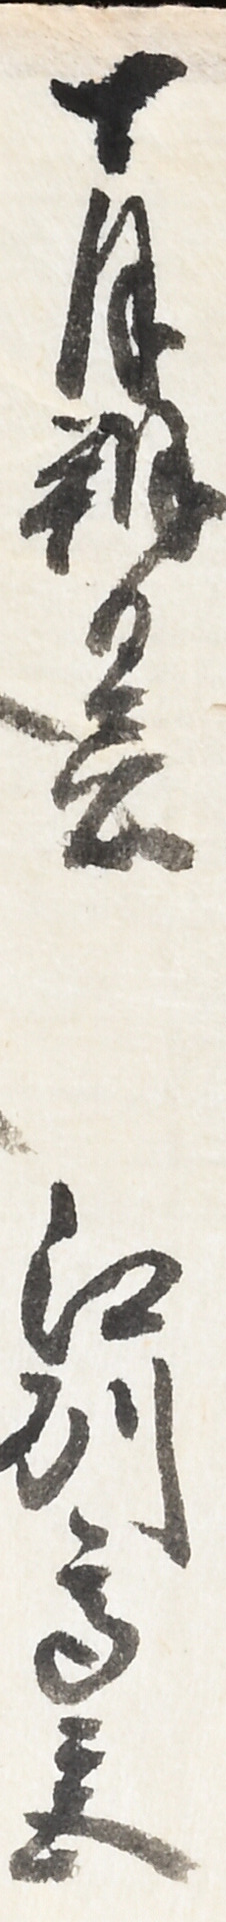十月朔日着江州高宮
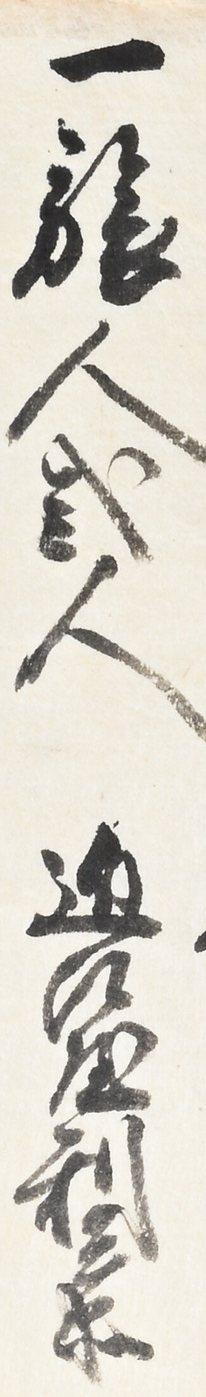一旅人弐人近江屋利兵衛
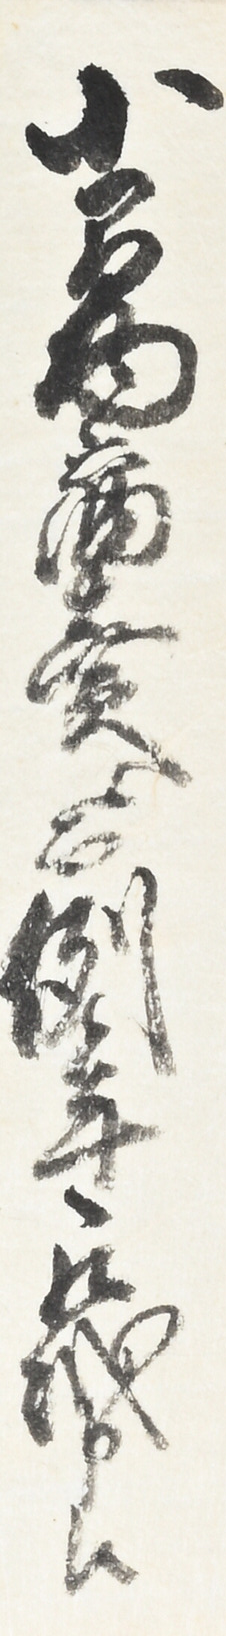小間物商売ニ而例年罷越申候
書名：旅人泊控帳
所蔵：伊那市立高遠町図書館・合同会社AMANE
